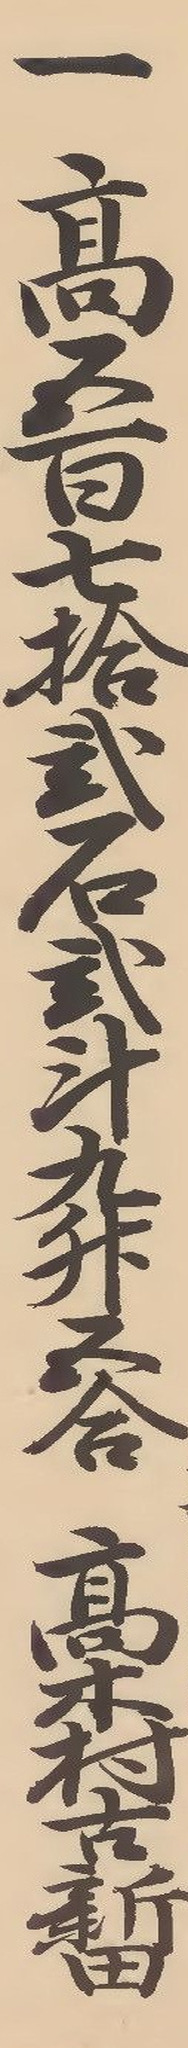一高五百七拾弐石弐斗九升五合高木村古新田
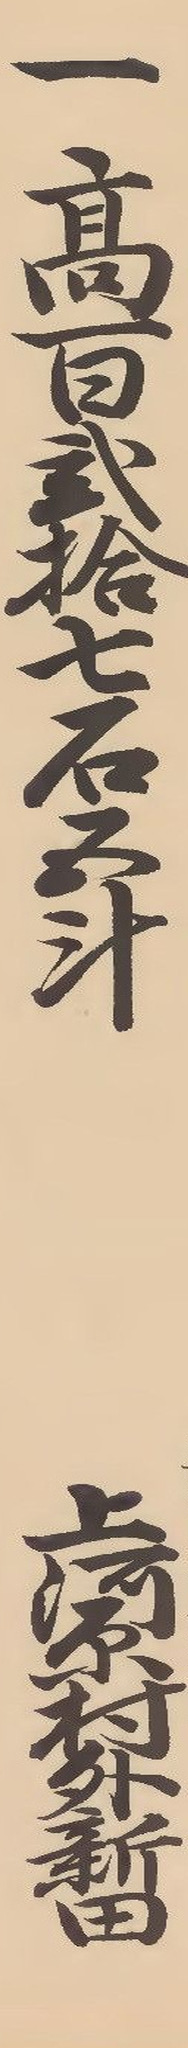一高百弐拾七石五斗上河原村外新田
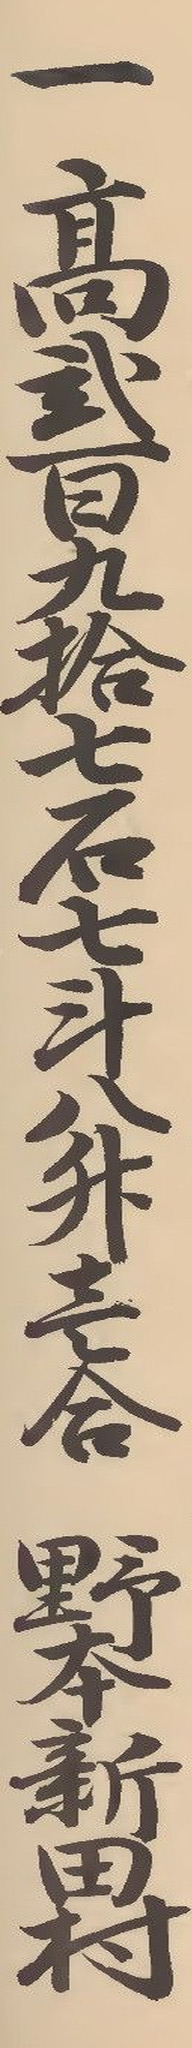一高弐百九拾七石七斗八升壱合野本新田村
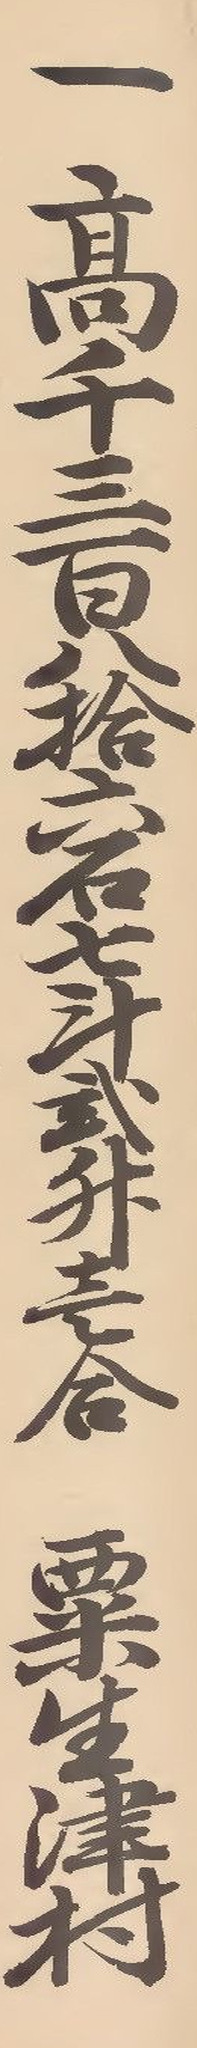一高千三百八拾六石七斗弐升壱合粟生津村
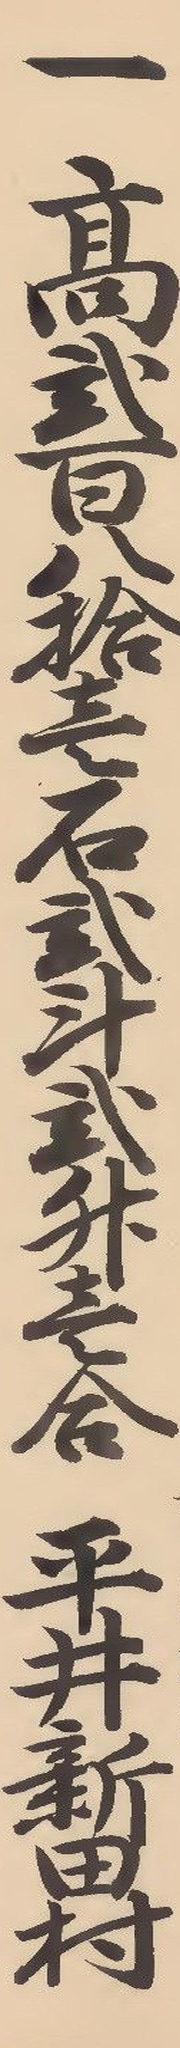一高弐百八拾壱石弐斗弐升壱合平井新田村
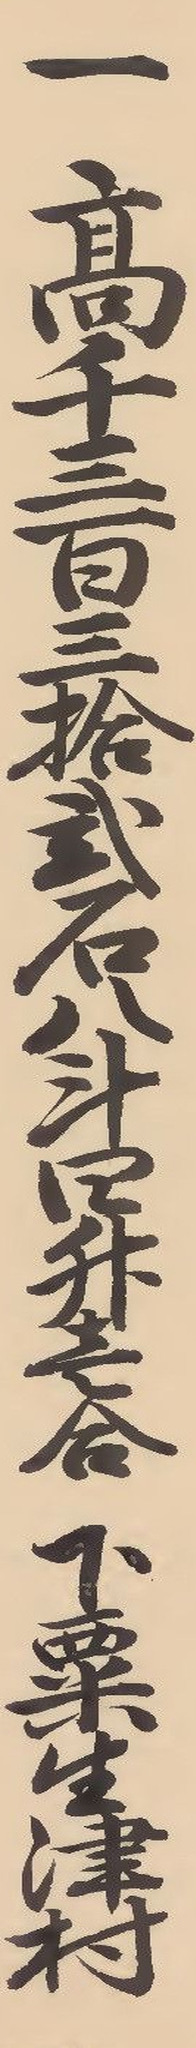一高千三百三拾弐石八斗四升壱合下粟生津村
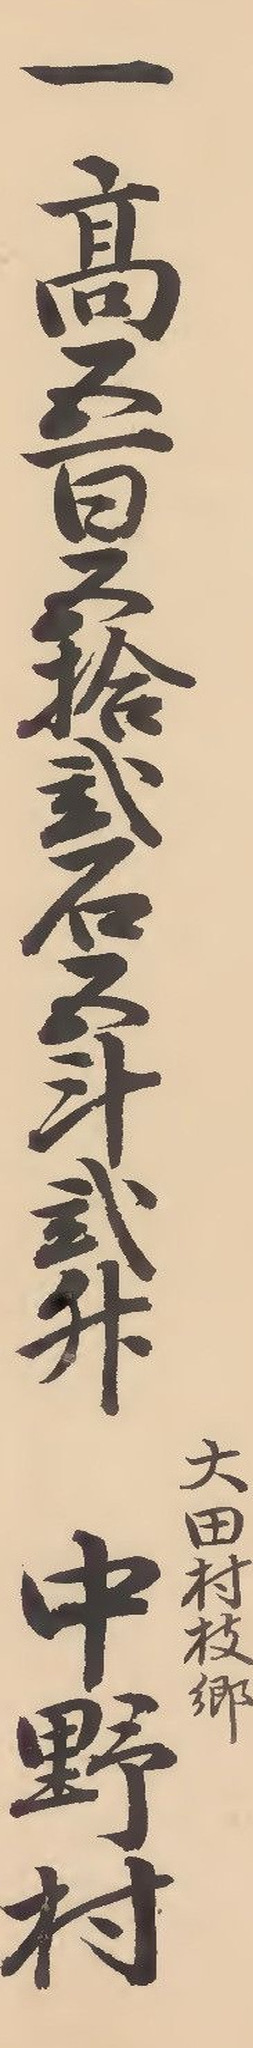一高五百五拾弐石五斗弐升中野村

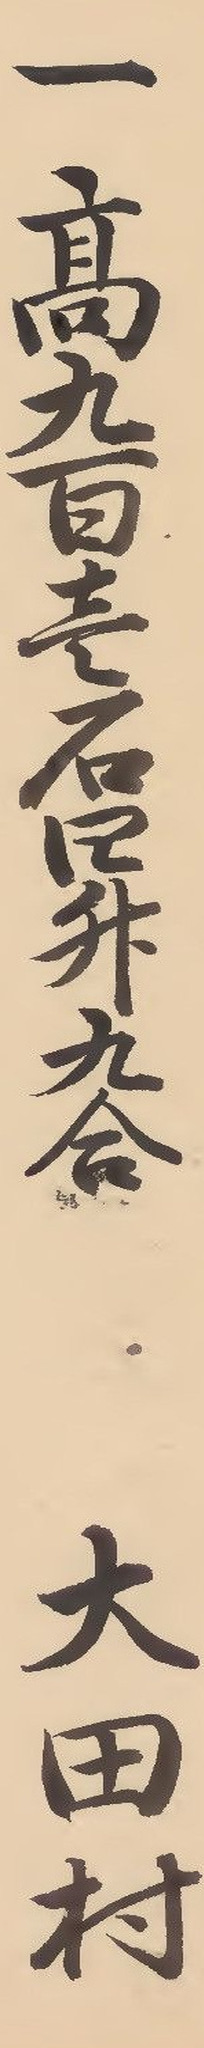一高九百壱石四升九合大田村
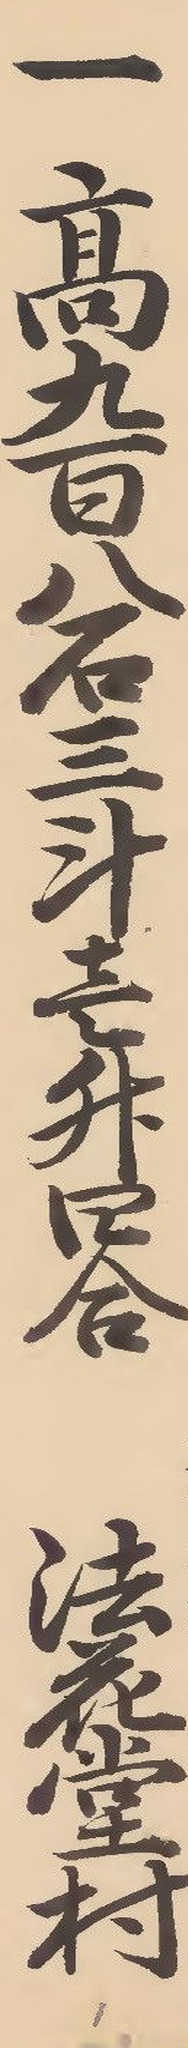一高九百八石三斗壱升四合法花堂村
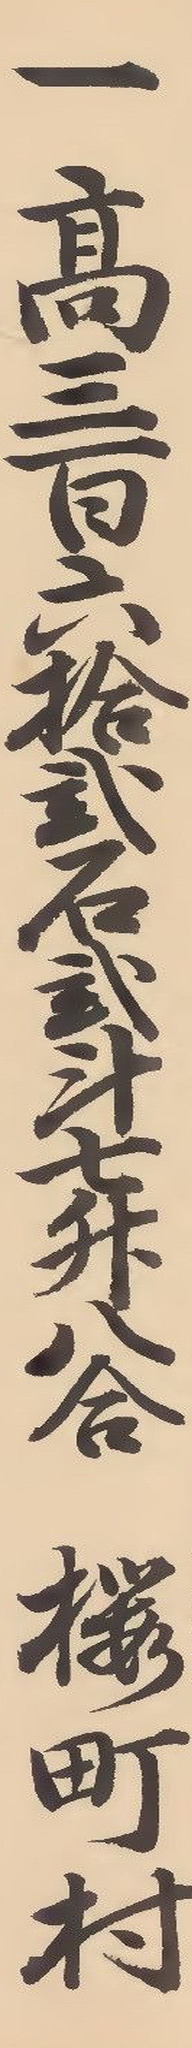一高三百六拾弐石弐斗七升八合桜町村
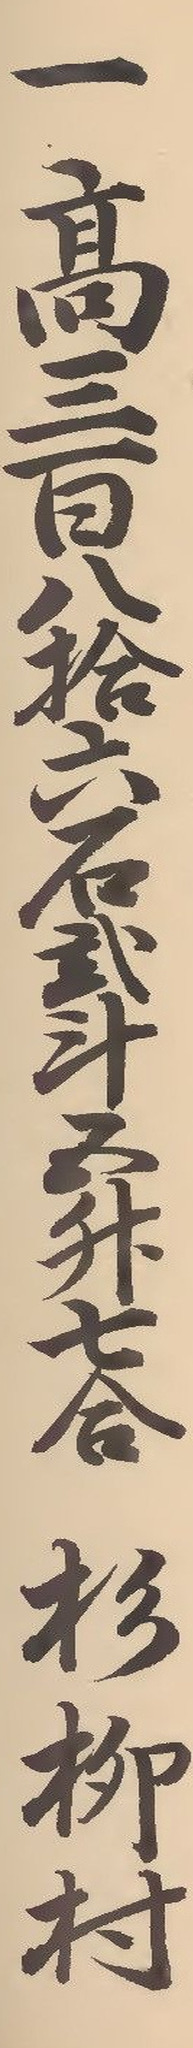一高三百八拾六石弐斗五升七合杉柳村
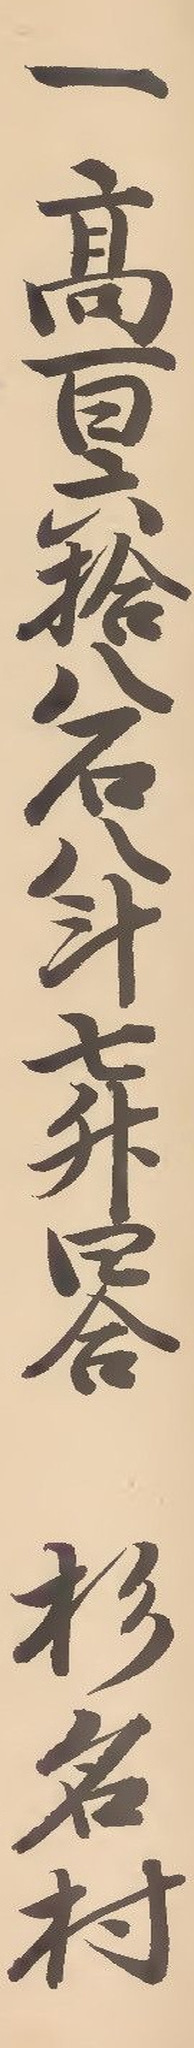一高百六拾八石八斗七升四合杉名村
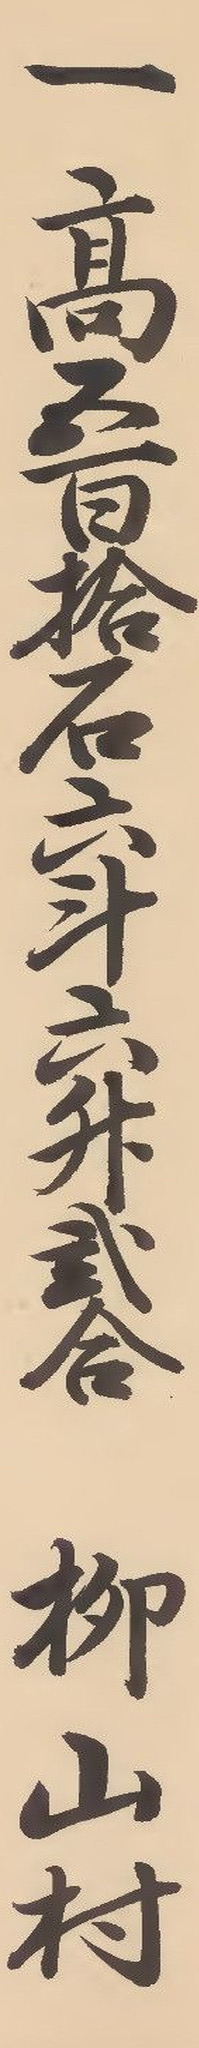一高五百拾石六斗六升弐合柳山村
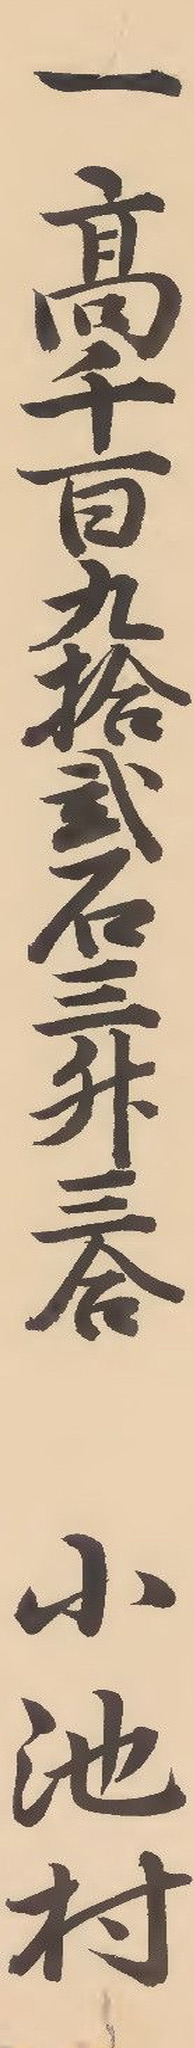一高千百九拾弐石三升三合小池村
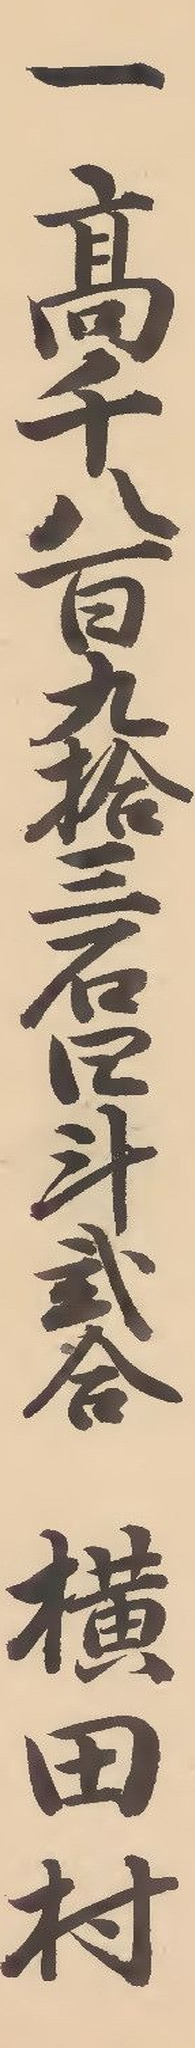一高千八百九拾三石四斗弐合横田村

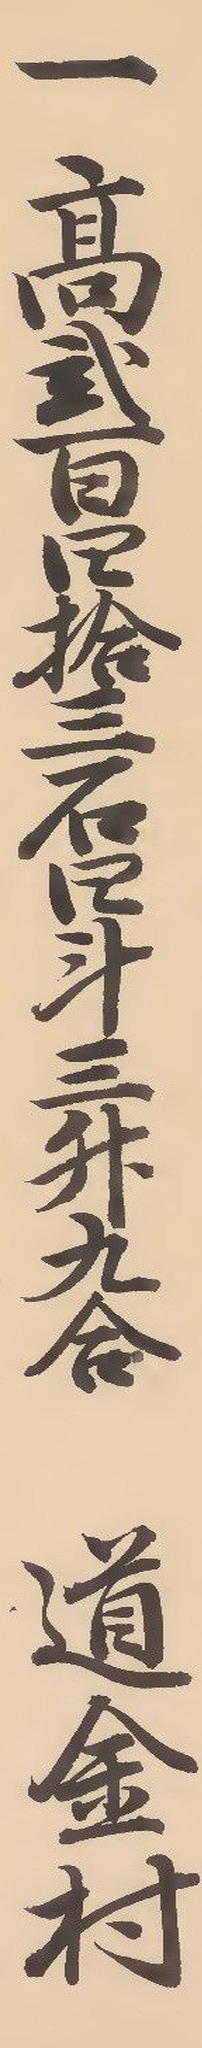一高弐百四拾三石四斗三升九合道金村
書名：越後国郷帳　下
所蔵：国立公文書館 National Archives of Japan
